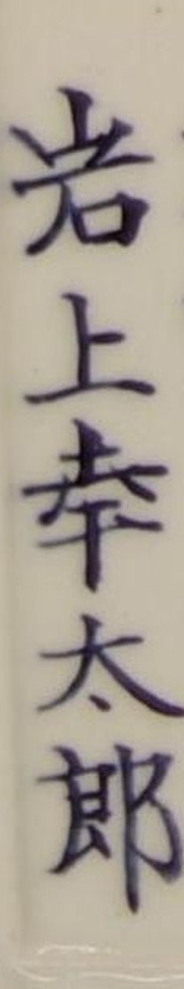岩上幸太郎

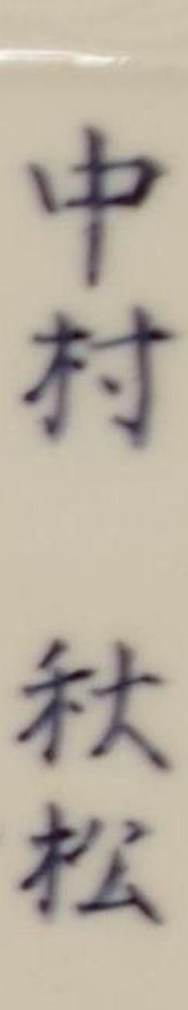中村秋松
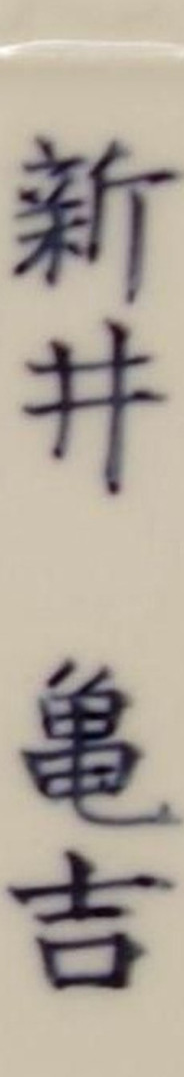新井亀吉
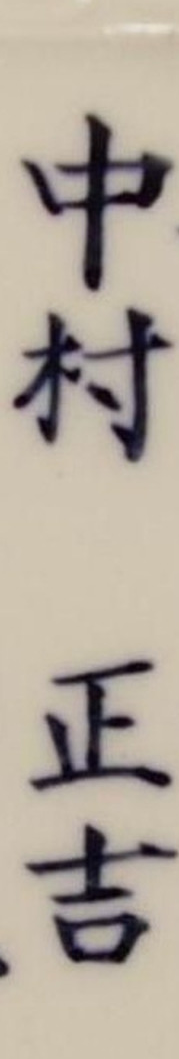中村正吉
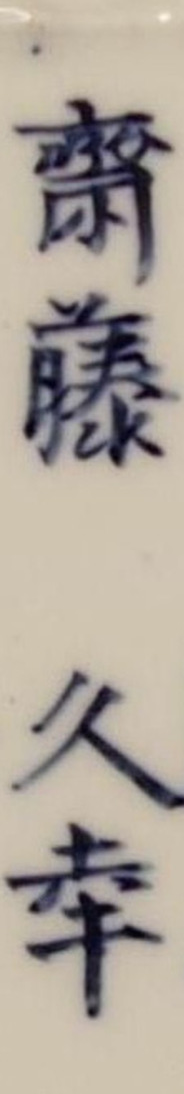斎藤久幸
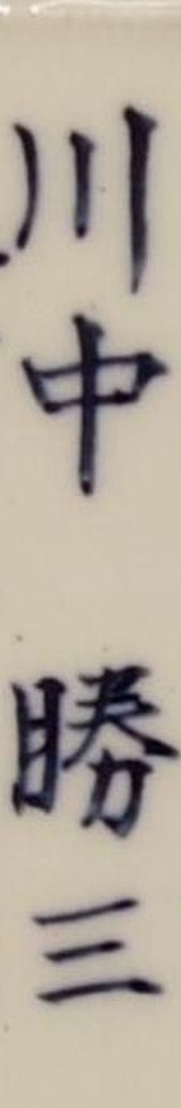川中勝三
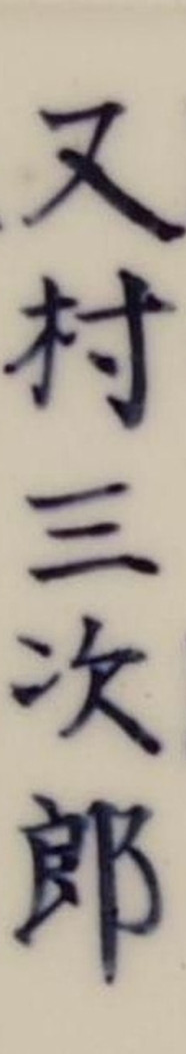又村三次郎
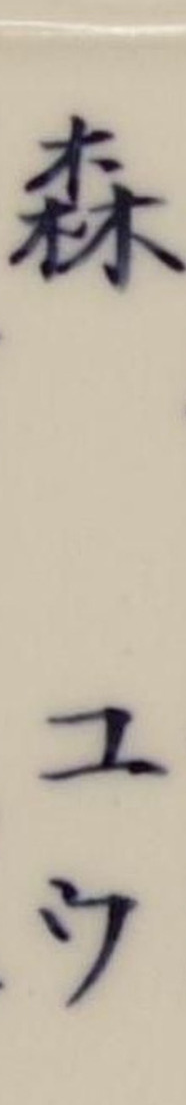森ユウ
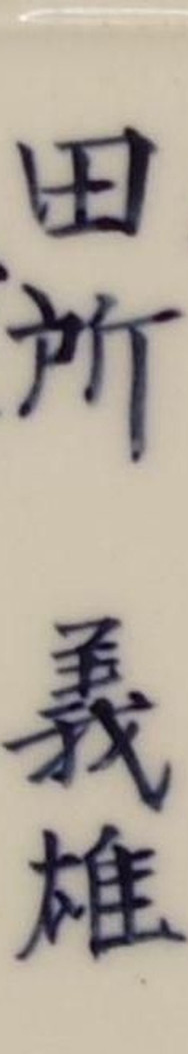田所義雄
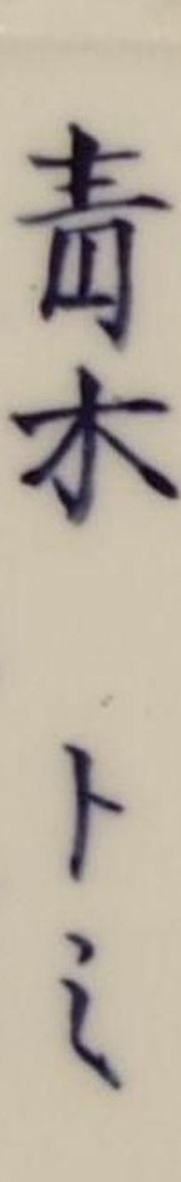青木トミ
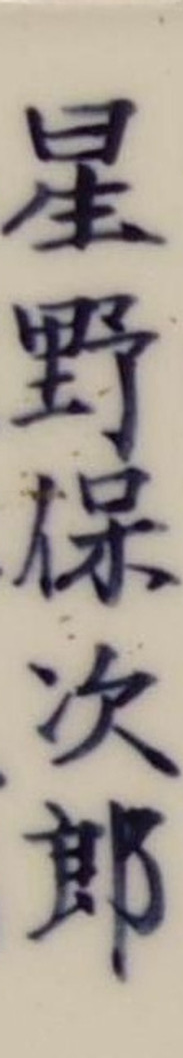星野保次郎
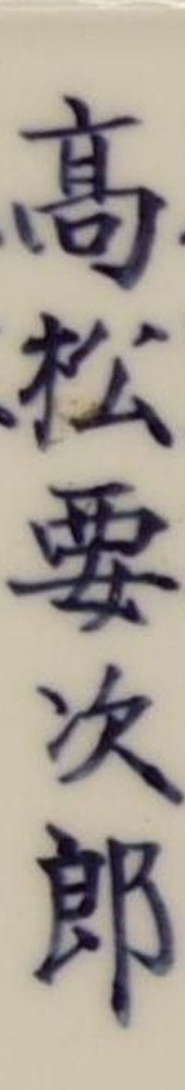高松要次郎
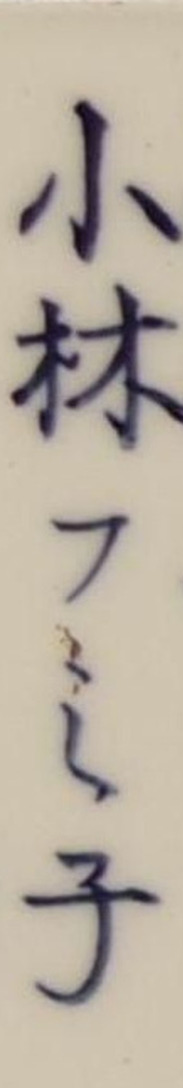小林フミ子

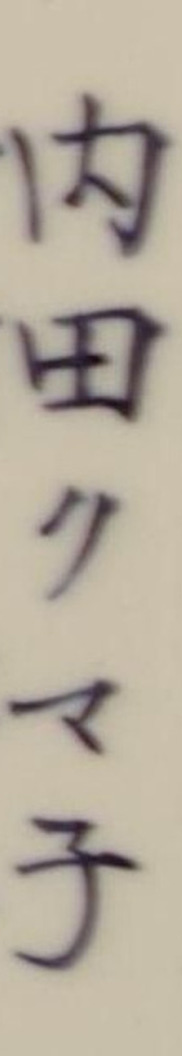内田クマ子
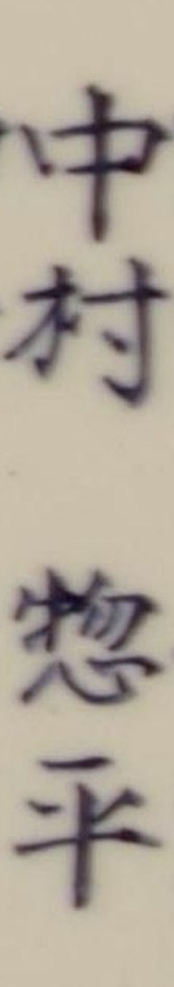中村惣平
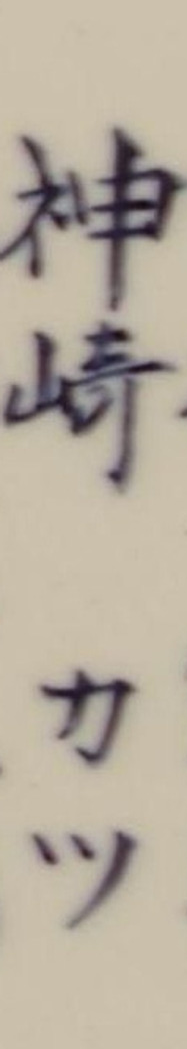神崎カツ
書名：M~S
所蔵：高野山金剛峯寺
